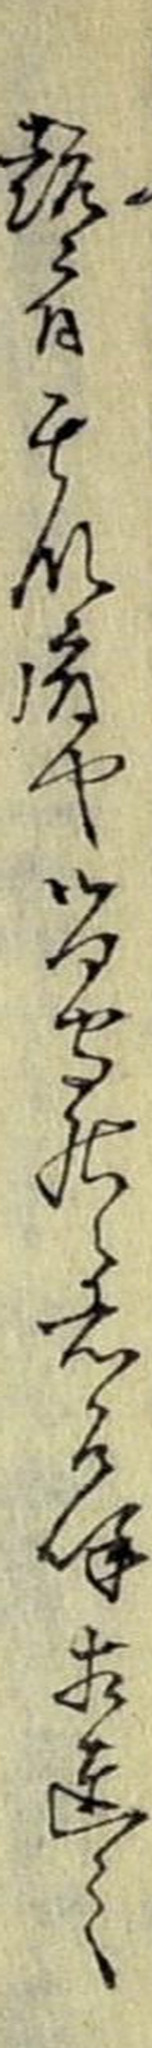趣ニ付其段府中留守居之者召呼相達之
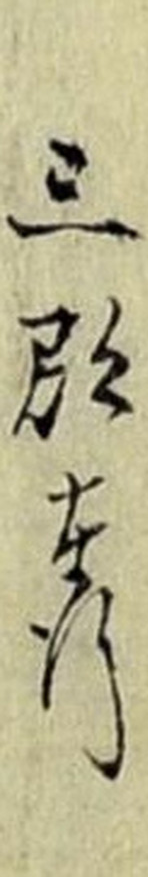三郡奉行
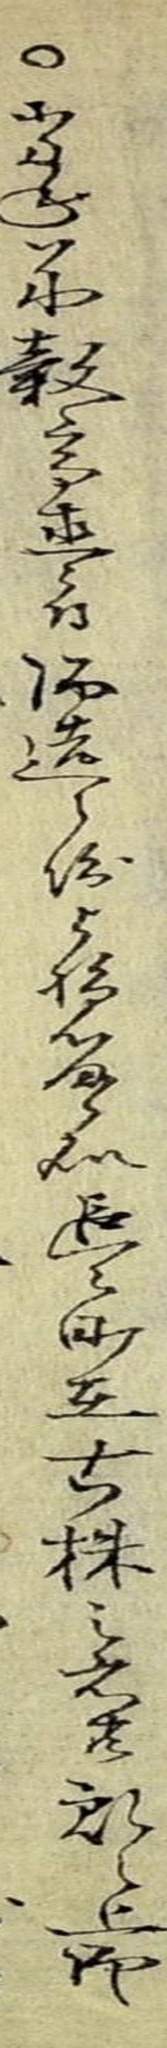○当年米穀高直ニ付酒造之儀被指留候処追々町在古株之者共願之上御
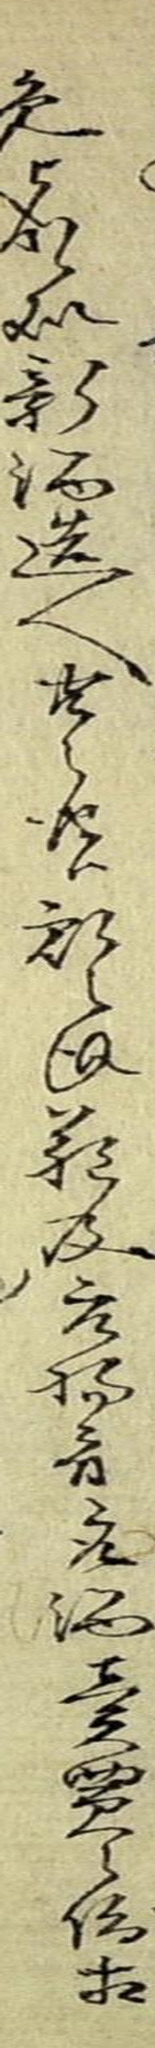免被成候処新酒造人共之儀ハ願之趣難及取揚ニ付取酒売買之儀相
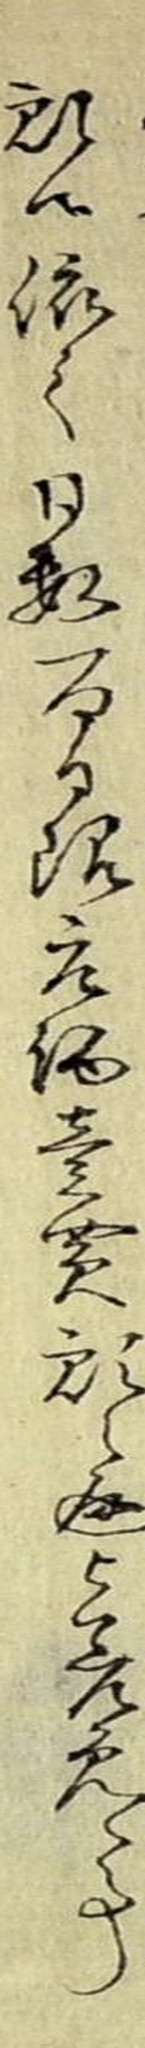願候依之日数百日限酒売買願之通被差免候事
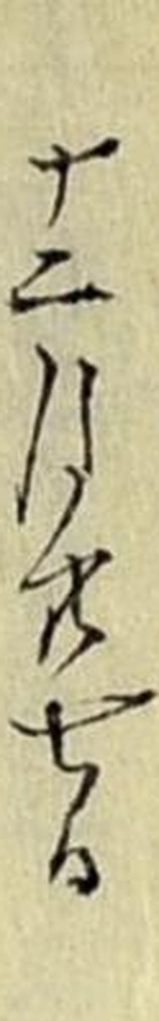十二月廿七日

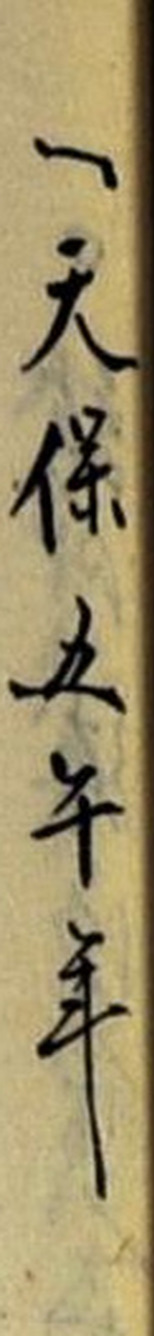一天保五午年
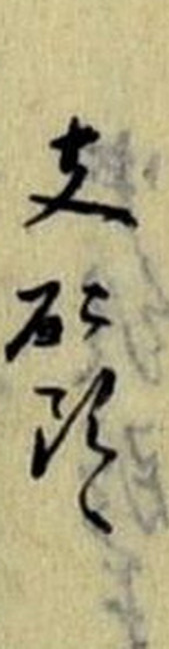支配頭へ
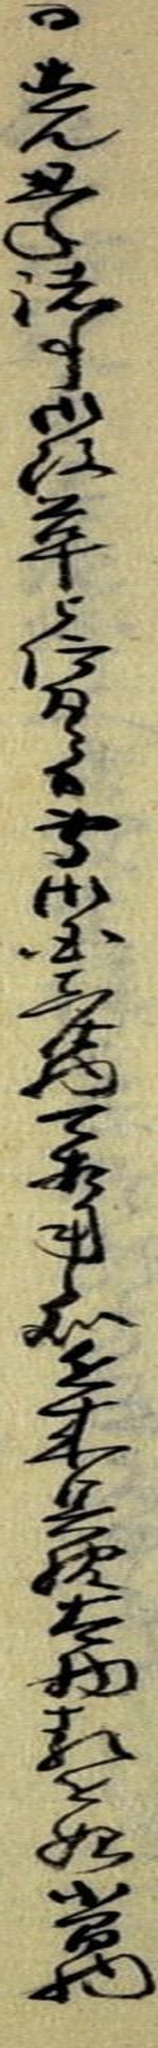○去ル丑年諸事御改革被仰付ニ付専御国産物可相用候処近来呉服太物類を始小間物
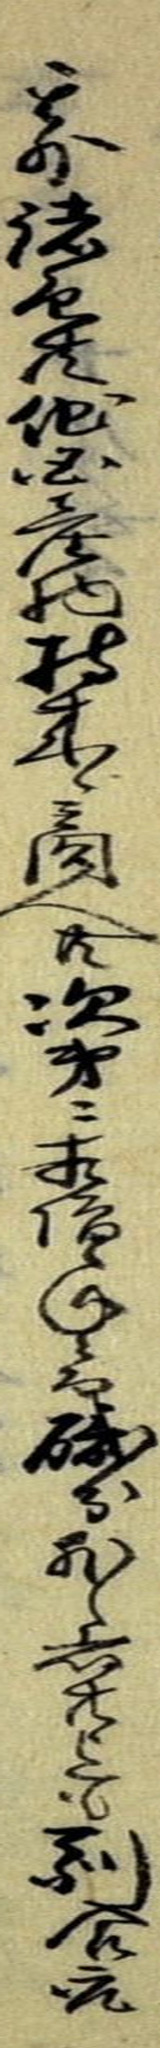其外諸色共他国産物持来候商人共次第ニ相増候趣ニ而職分外之者共迄も馴合取
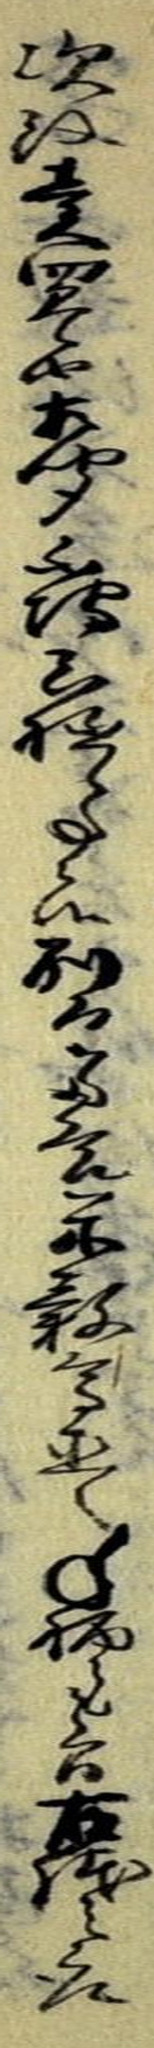次致売買候由相聞不埒至極之事ニ候別而当節米穀高直之年柄ニも候間右体之取
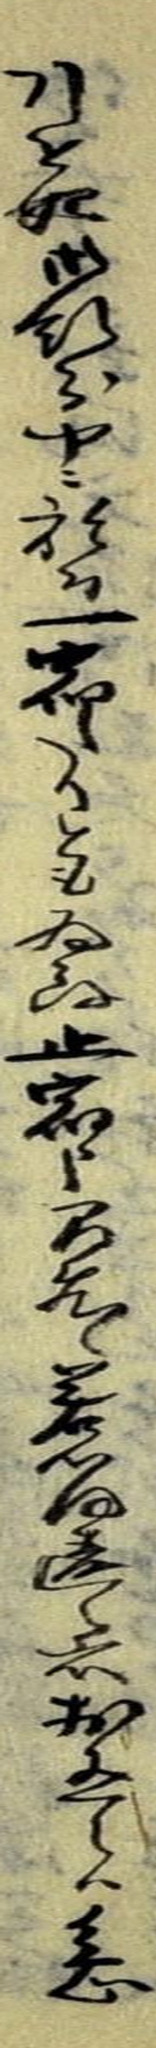引を始御領分中ニ於而一宿たりも為致止宿申間敷候若心得違之者於有之ハ急
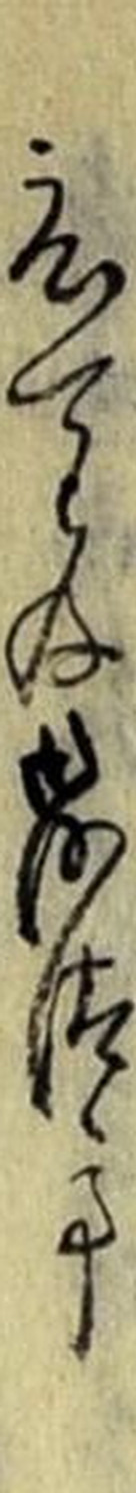度可被及御沙汰候事
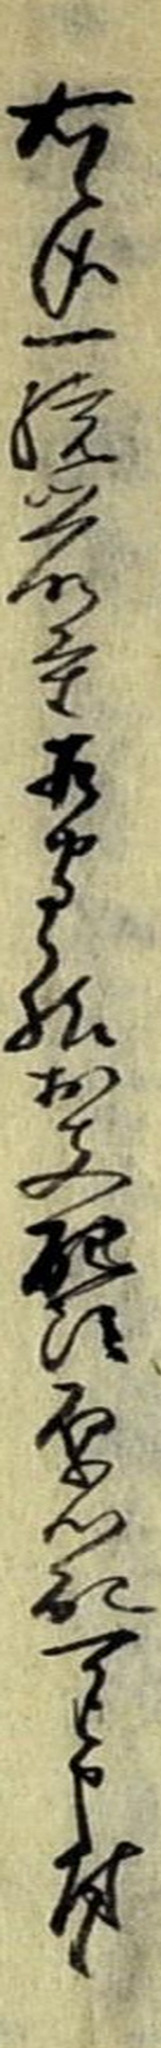右之趣一統厳重相守候様於支配頭厚心配可被申付候
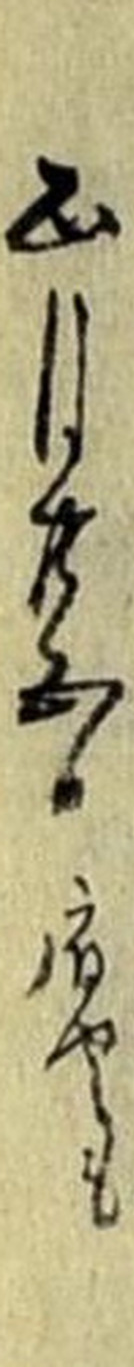正月廿五日府中へも
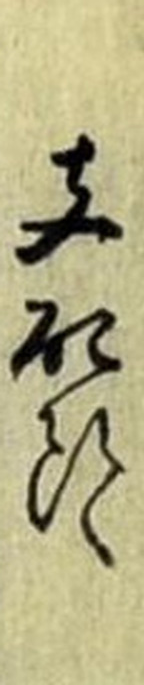支配頭へ
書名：命令之部 五
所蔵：福井県文書館 Fukui Prefectural Archives
